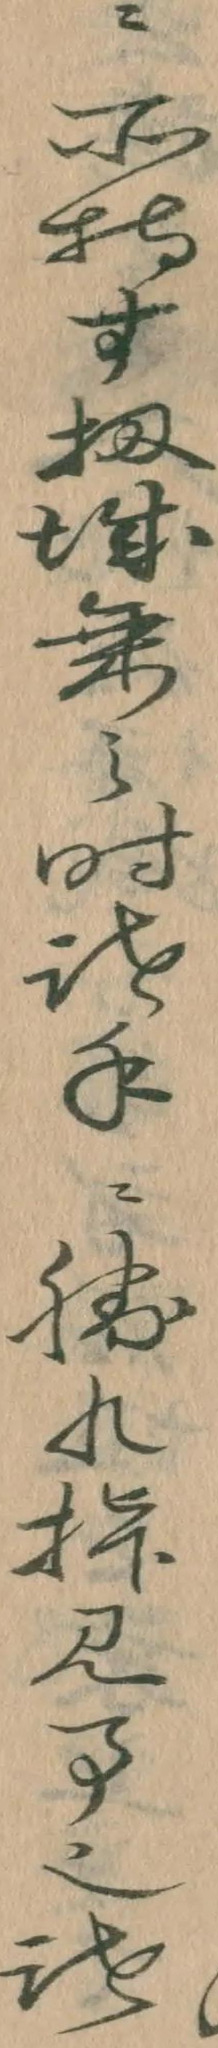に所持す扨城乗之時諸手に勝れ挊見事也諸
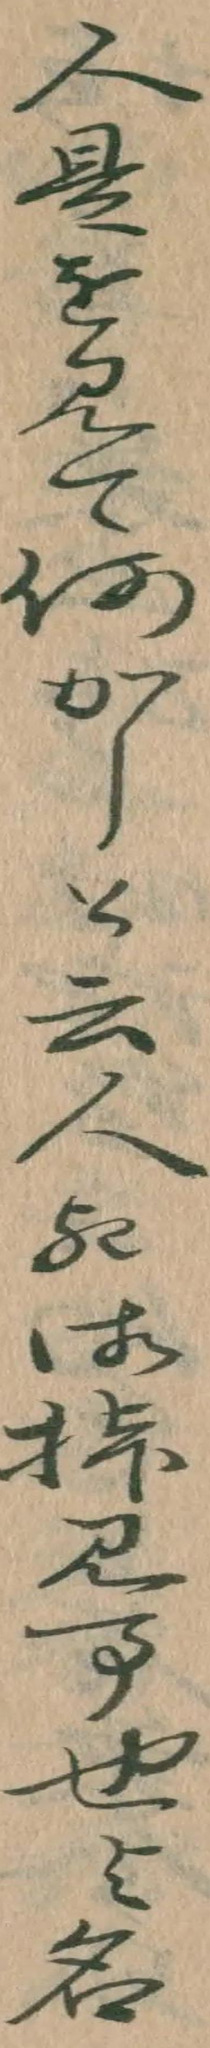人是を見て何がしと云人歟御挊見事也与名
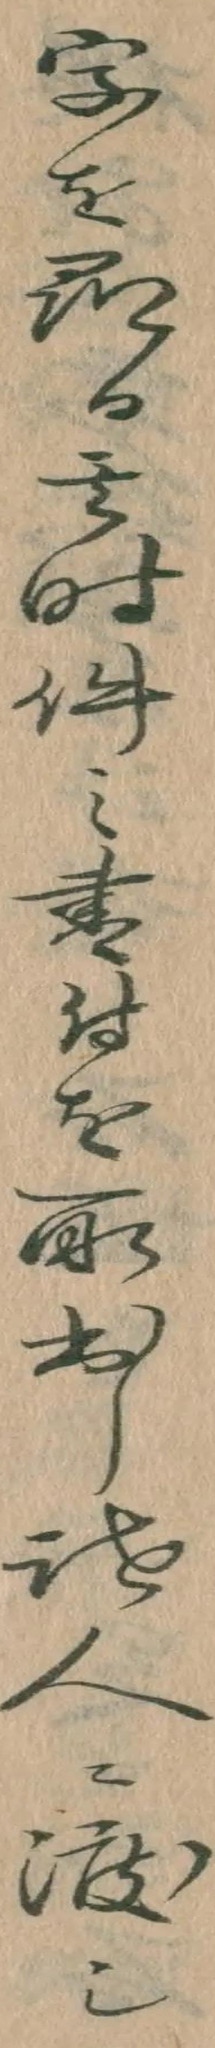字を尋る其時件之書付を取出し諸人に渡し
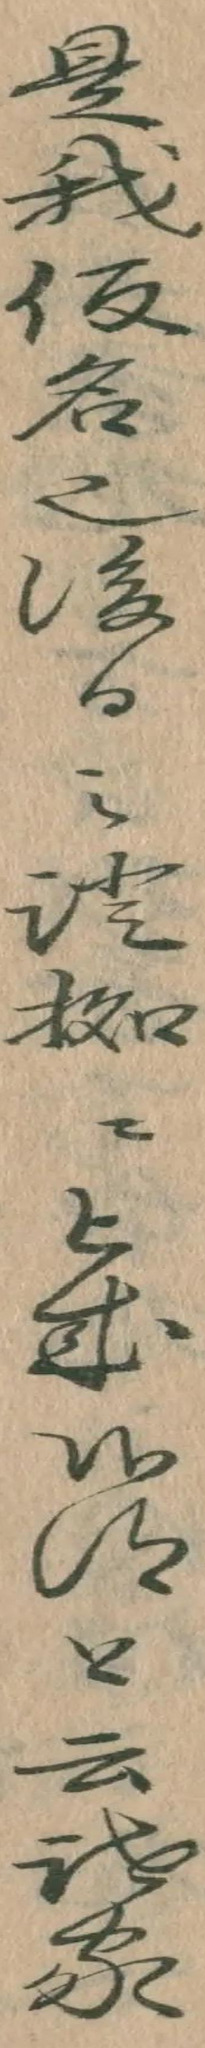是我仮名也後日之證拠に被成候得と云諸家
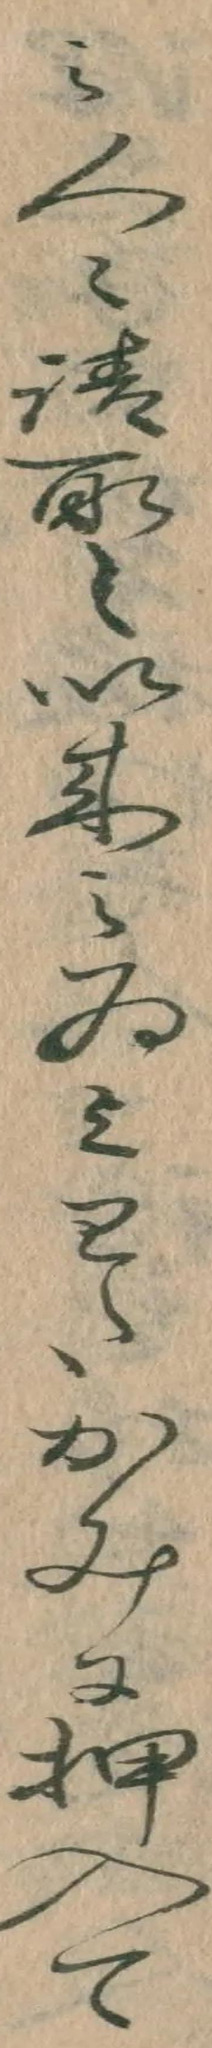之人に請取之以来之ゐ与已たかみ尓押入て
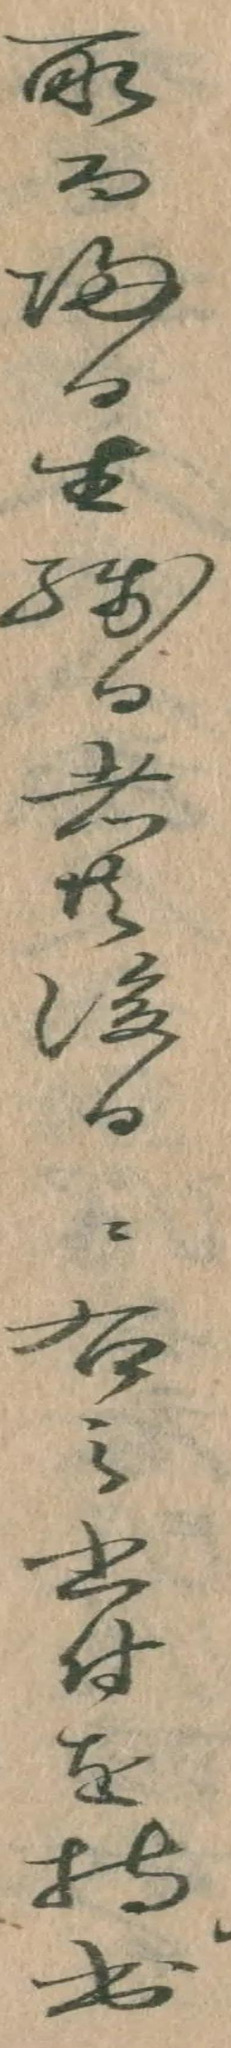取而帰る生残る者共後日に右之書付を持出
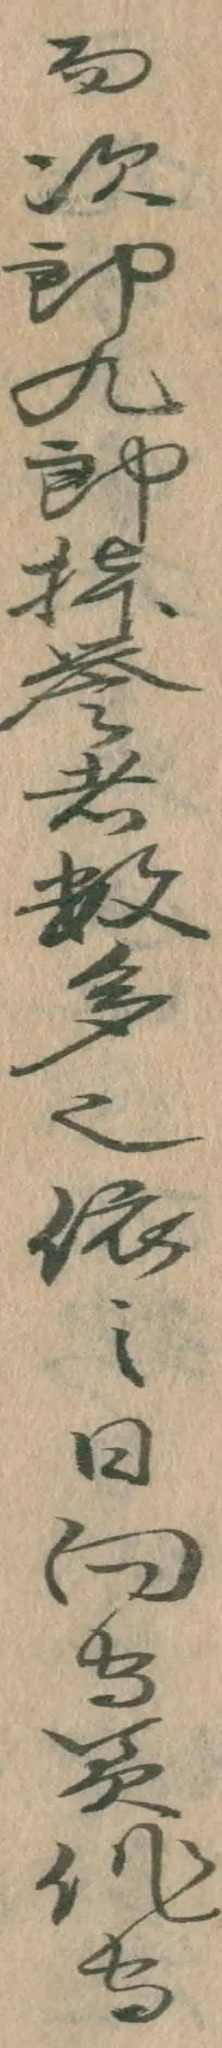而次郎九郎挊誉者数多也依之日向守美作守
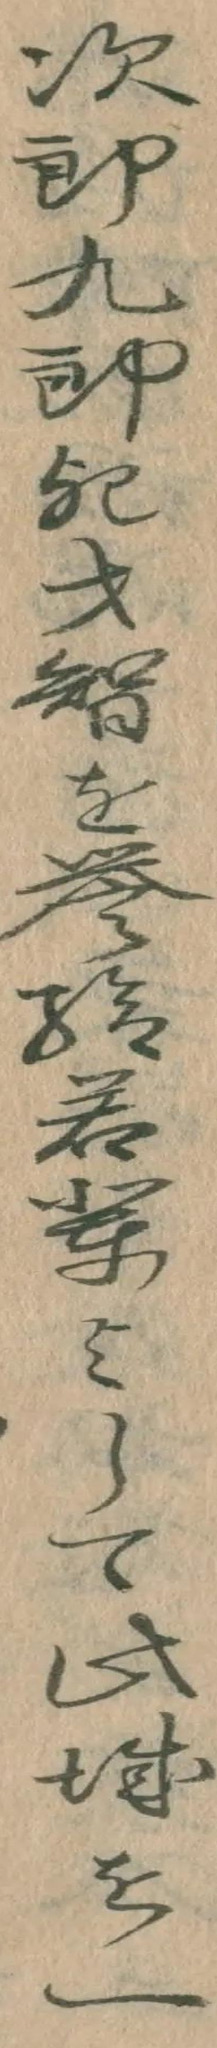次郎九郎歟才智を誉給若輩与して此城を一
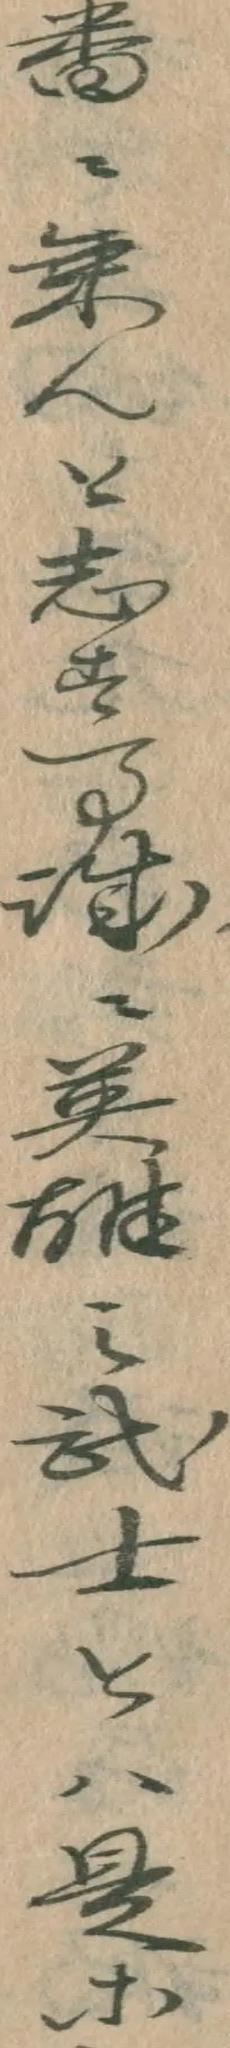番に乗んと志春事誠に英雄之武士とは是等
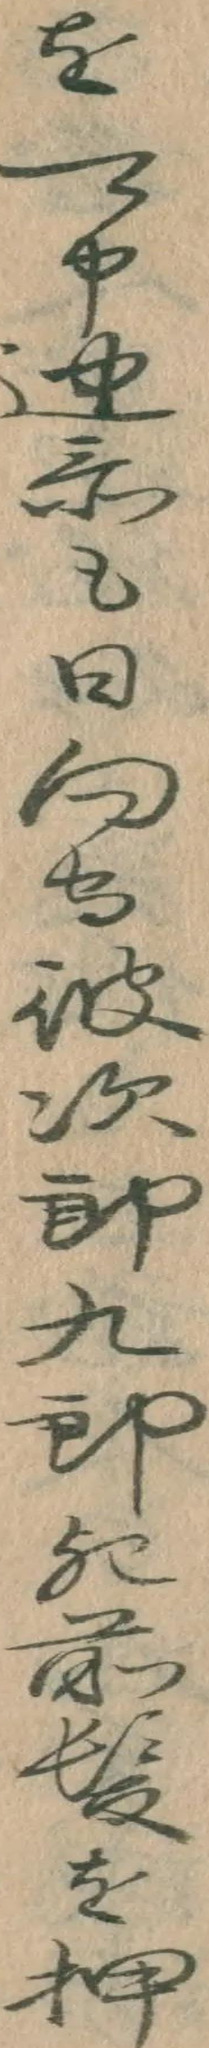を可申迚忝も日向守彼次郎九郎歟前髪を押
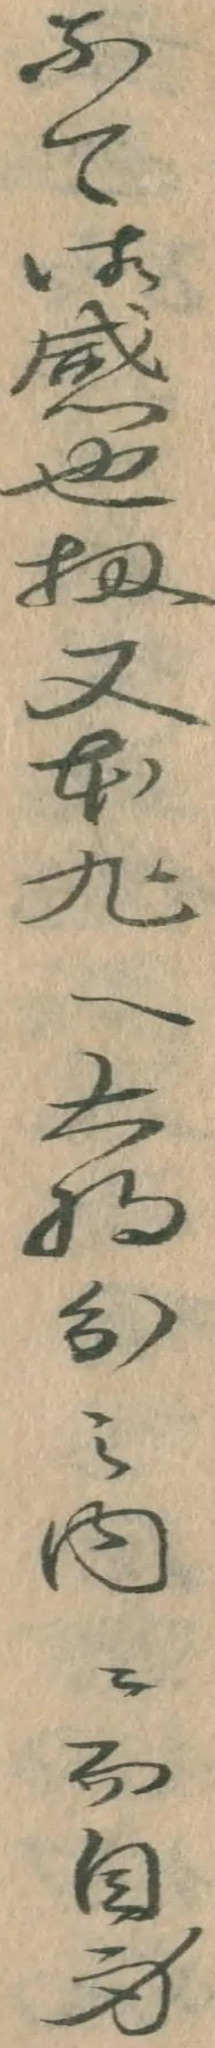なて御感也扨又本丸へ大将分之内に而自身

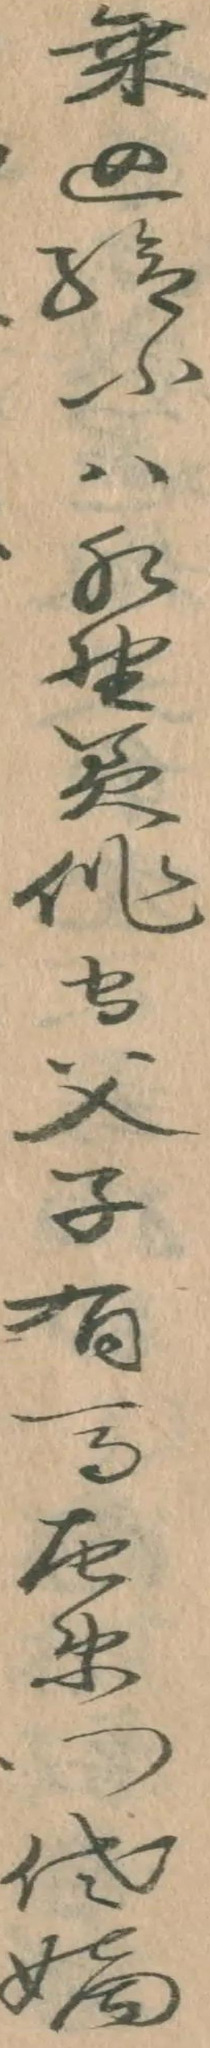乗込給ふは水野美作守父子有馬左衛門佐嫡
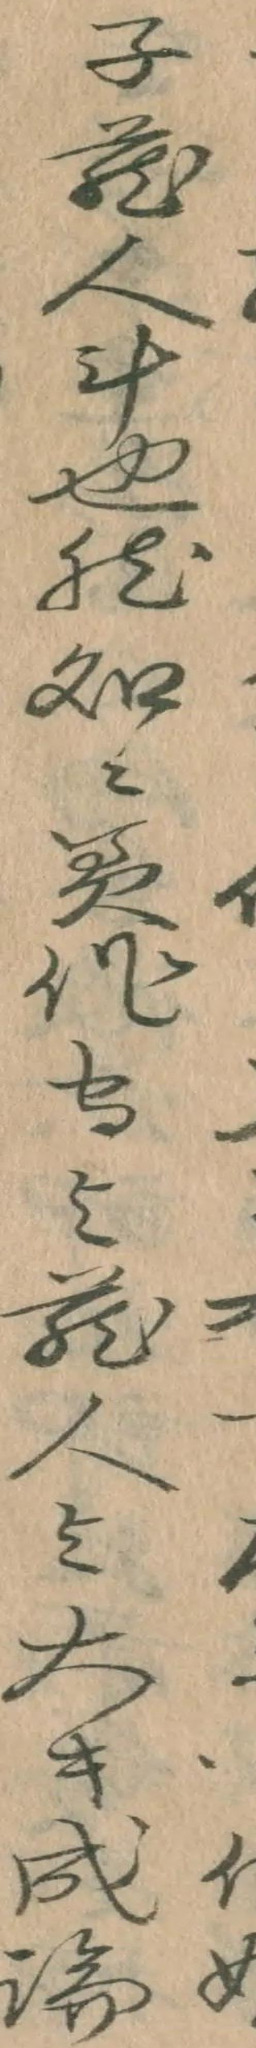子蔵人斗也然処に美作守与蔵人与大き成論
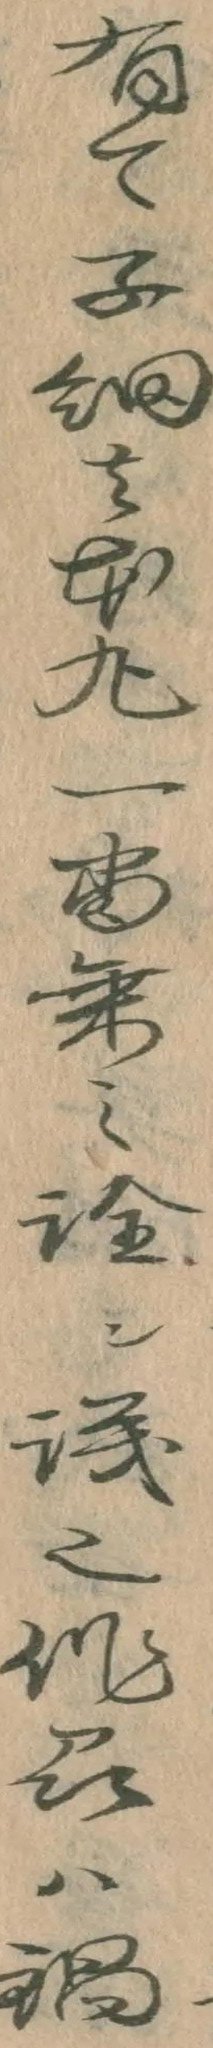有て子細者本丸一番乗之詮し議也作州は鍋
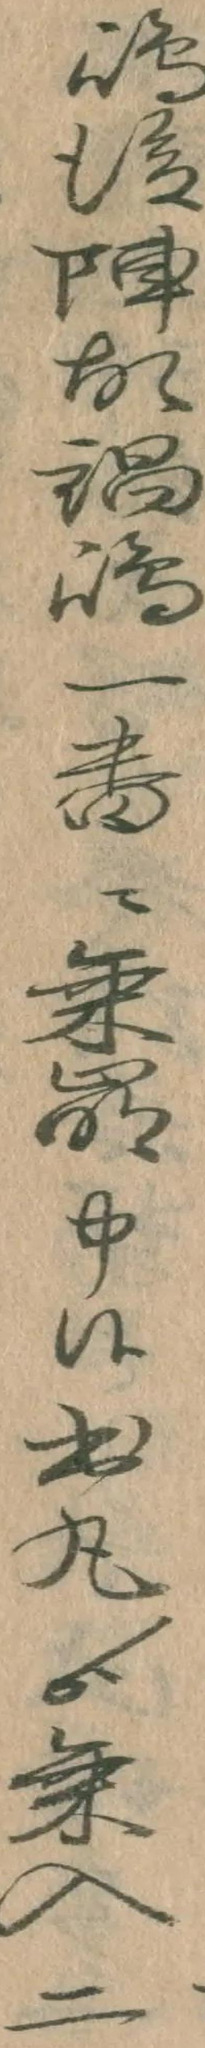島後陣故鍋島一番に乗崩申候出丸ゟ乗入二
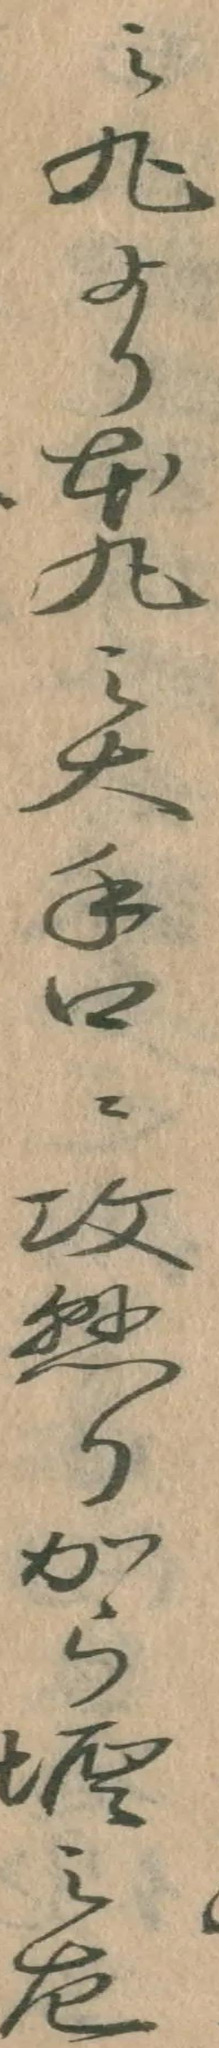之丸より本丸之大手口に攻懸りから堀之左
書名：切支丹御退治記 49巻. [7]
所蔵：国立国会図書館 National Diet Library, JAPAN
